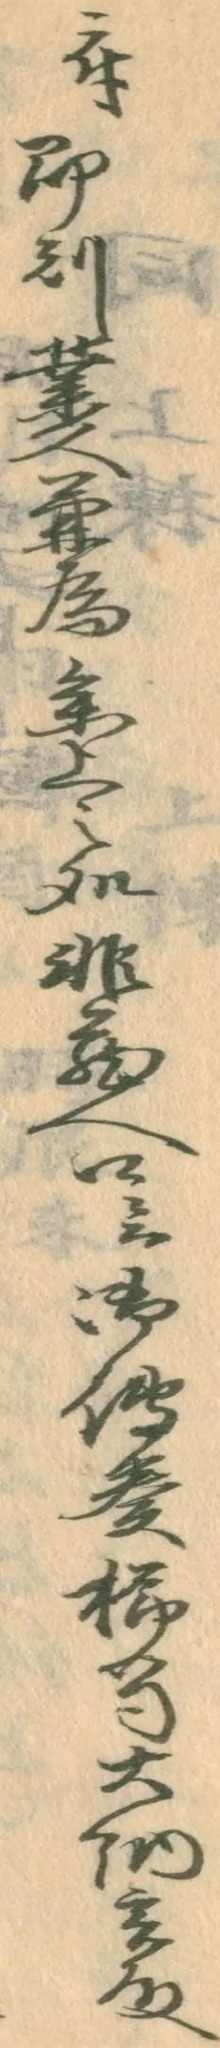ニ付即刻業久兼為参上之処非蔵人口ニ而御伝奏櫛笥大納言殿
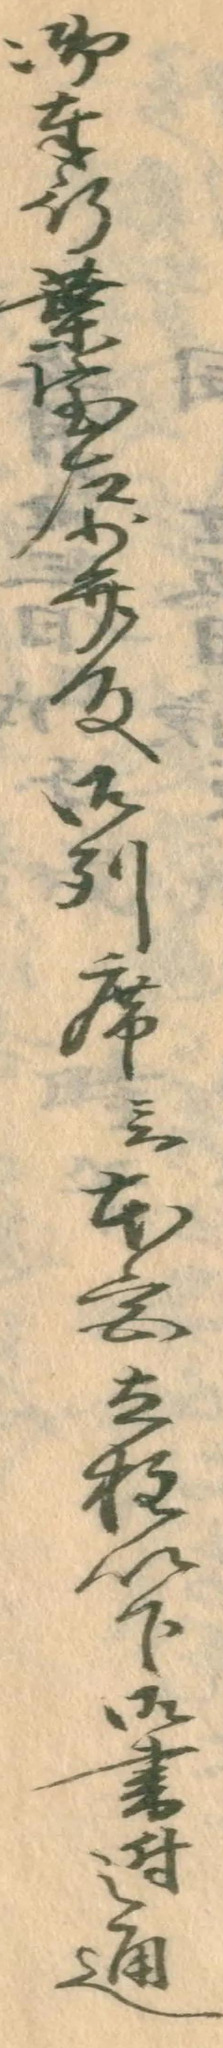御奉行葉室左少弁殿御列席ニ而本宮立柱以下御書付之通
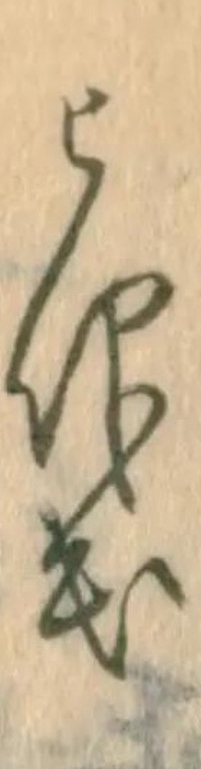被仰出
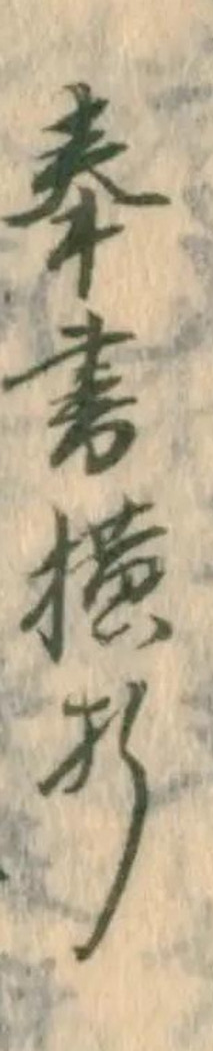奉書横折
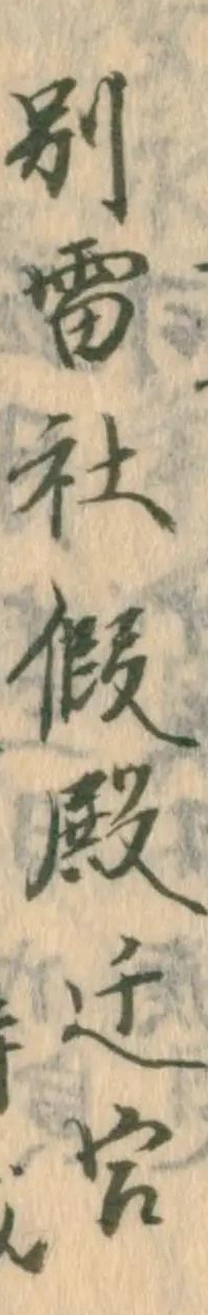別雷社仮殿迁宮
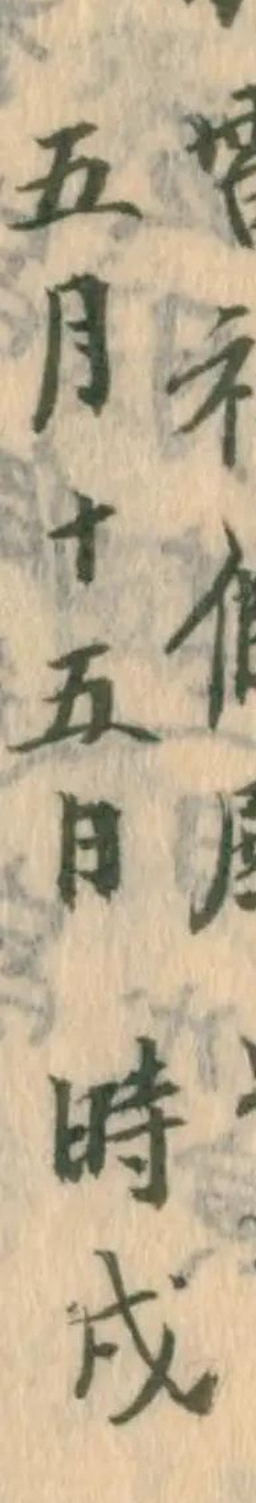五月十五日時戌
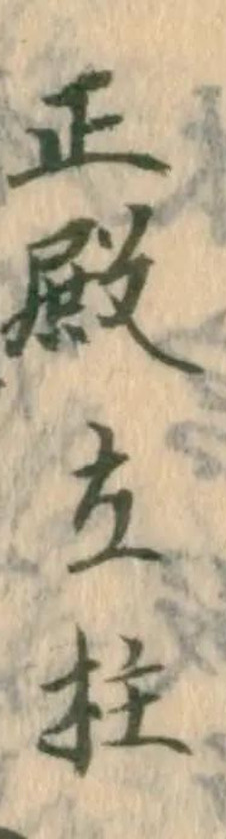正殿立柱
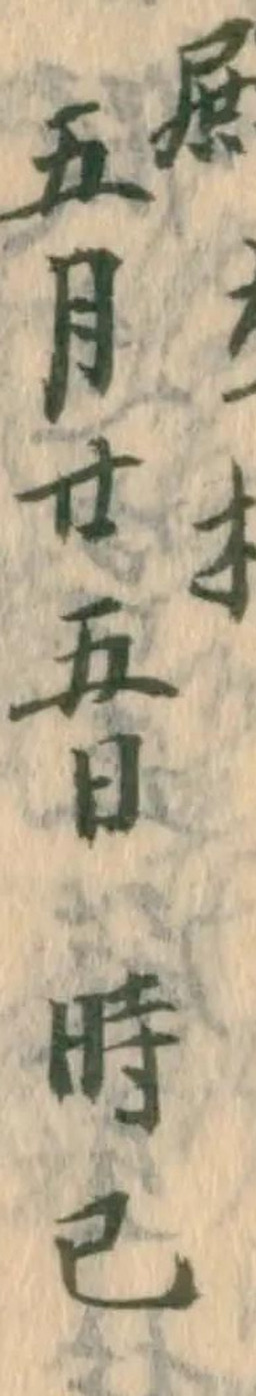五月廿五日時己
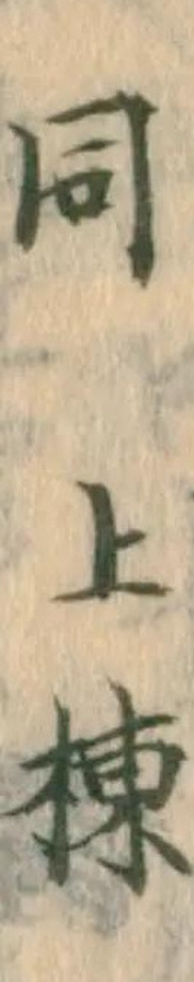同上棟
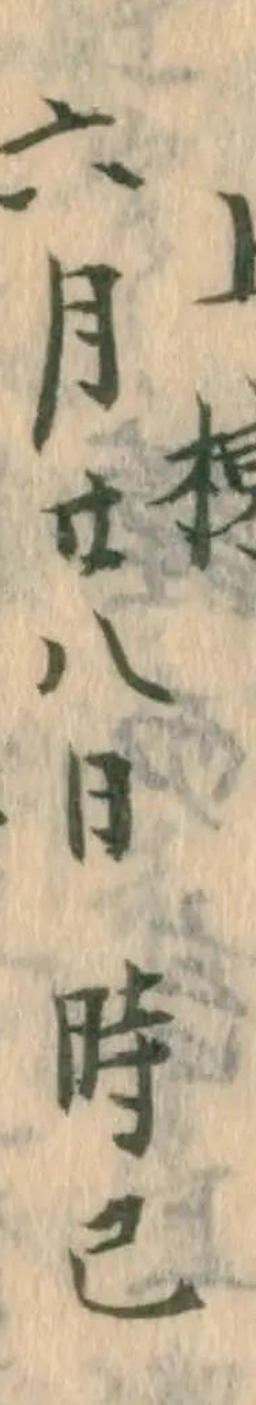六月廿八日時己
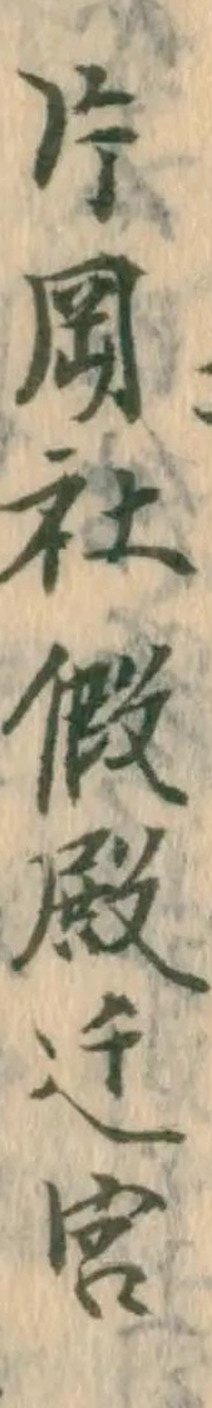片岡社仮殿迁宮
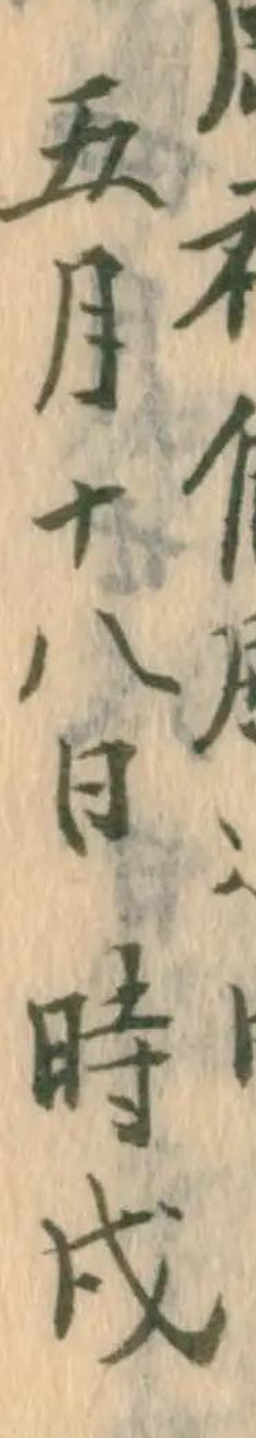五月十八日時戌
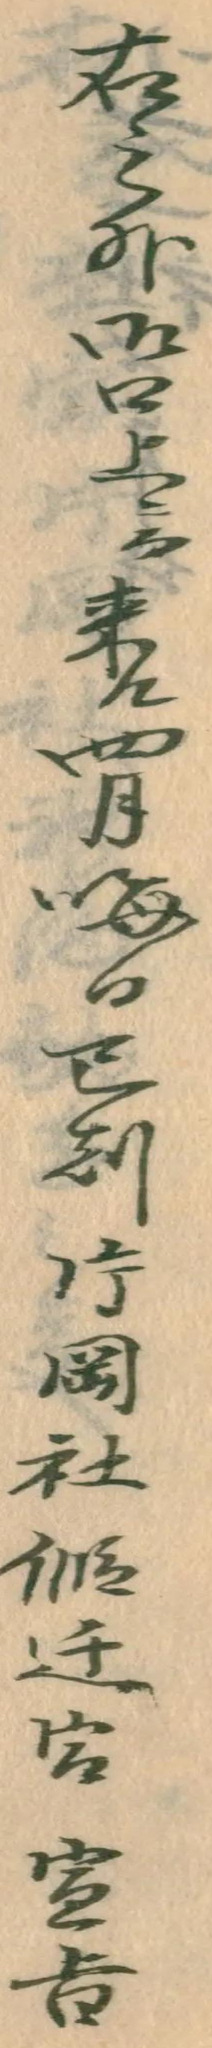右之外御口上ニ而来ル四月晦日巳刻片岡社仮迁宮宣旨
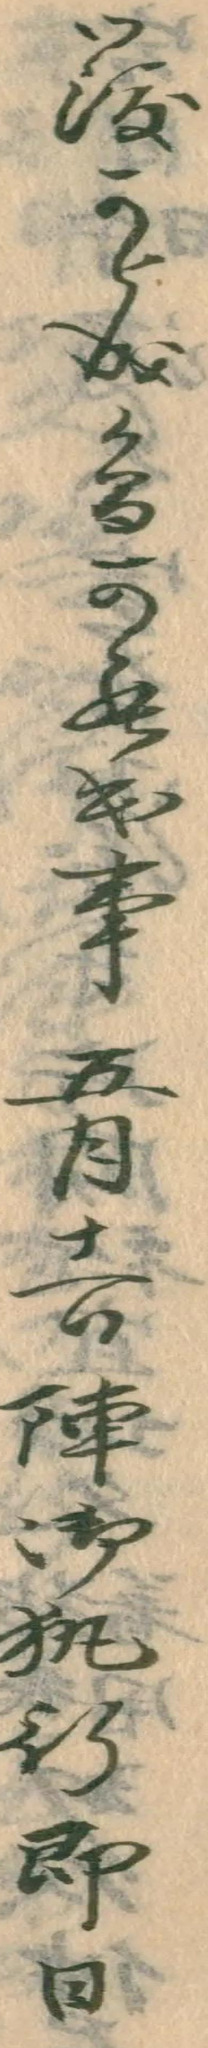御渡可被成候間可罷出事五月十一日陣御執行即日
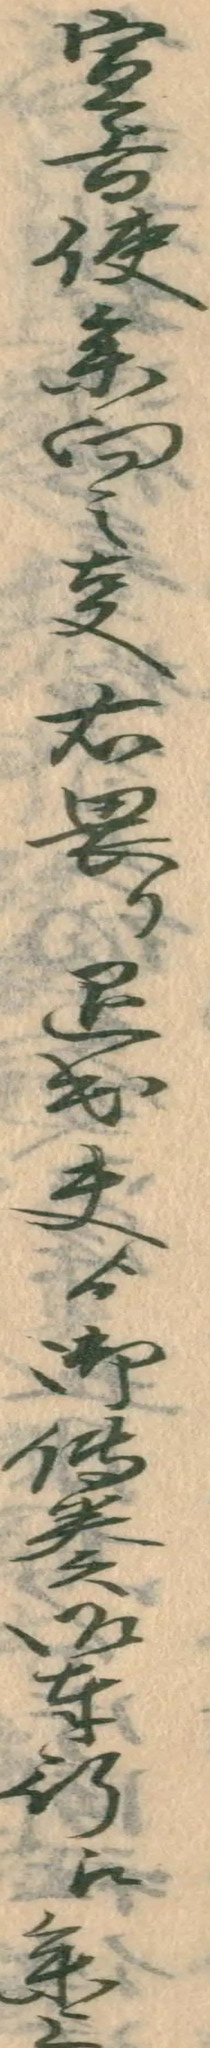宣旨使参向之事右畏り退出夫ゟ御伝奏御奉行江参上
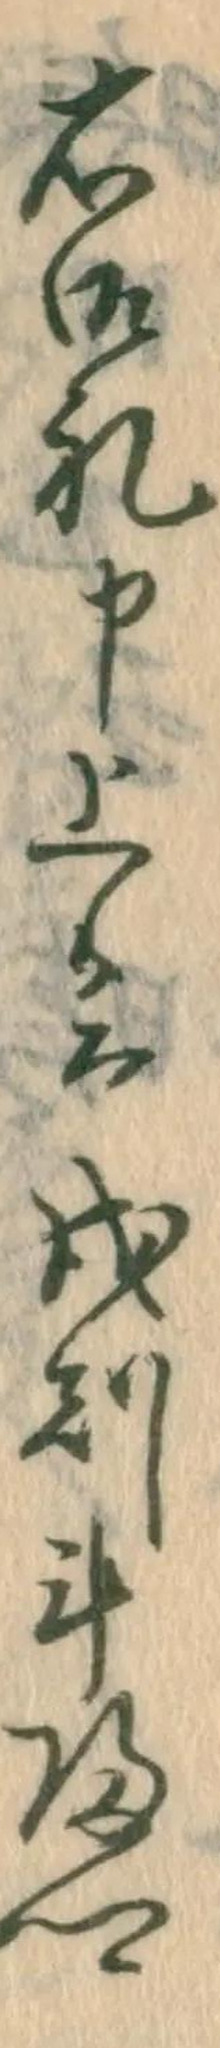右御礼申上候而戌刻計帰郷
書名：賀茂社記録. 第17冊
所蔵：国立国会図書館 National Diet Library, JAPAN
